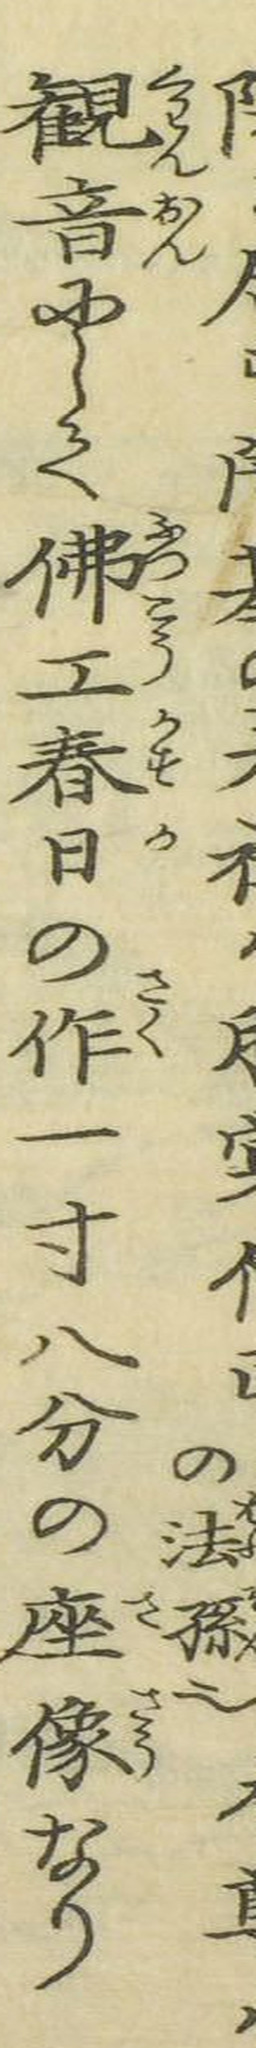観音にして佛工春日の作一寸八分の座像なり
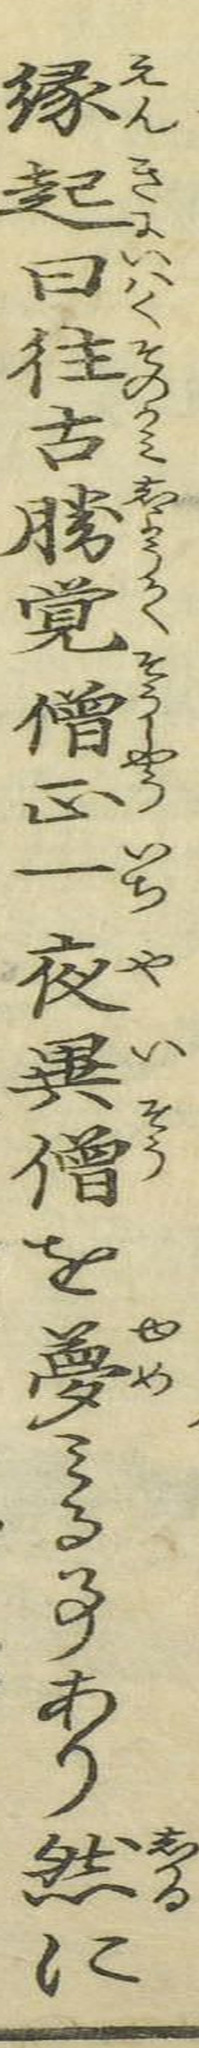縁起曰往古勝覚僧正一夜異僧を夢みる事あり然に
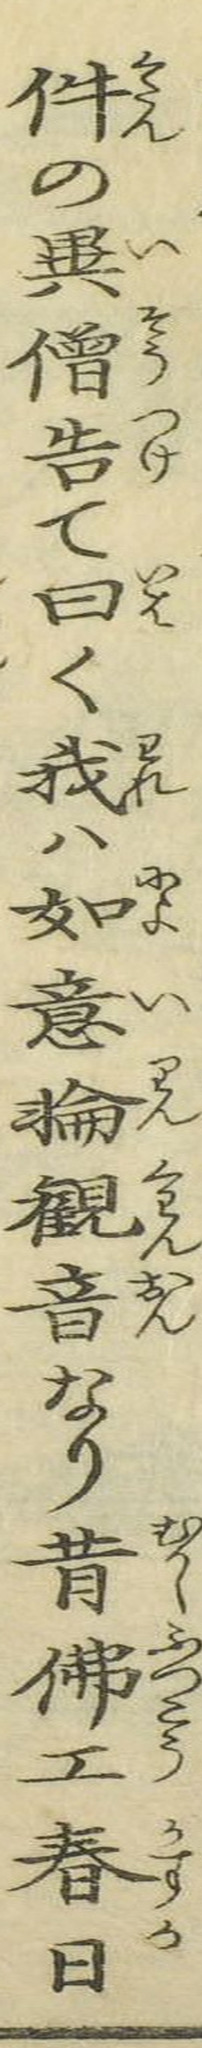件の異僧告て曰く我は如意輪観音なり昔佛工春日
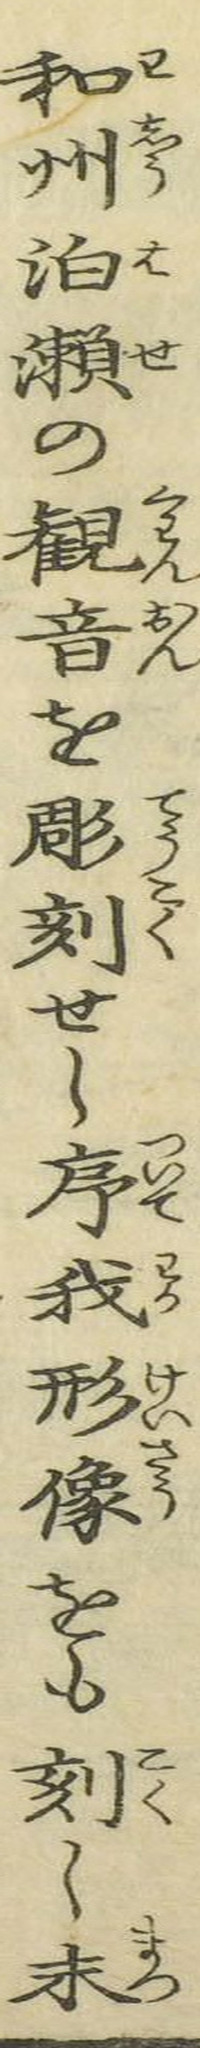和州泊瀬の観音を彫刻せし序我形像をも刻し末
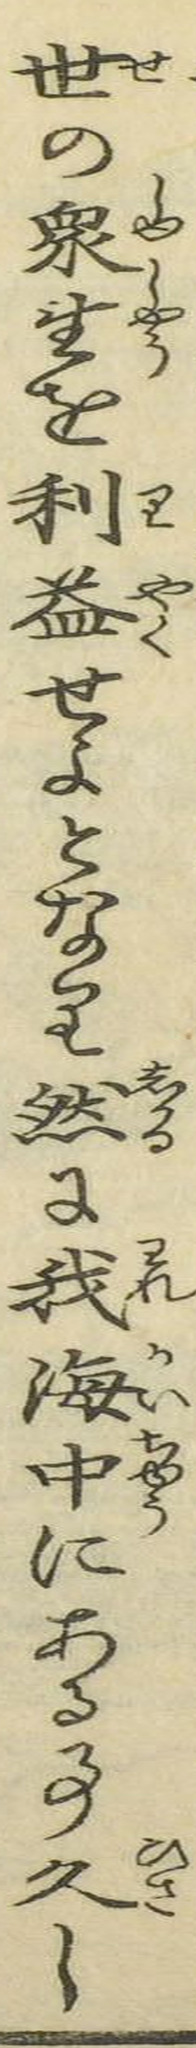世の衆生を利益せよとなり然に我海中にある事久し
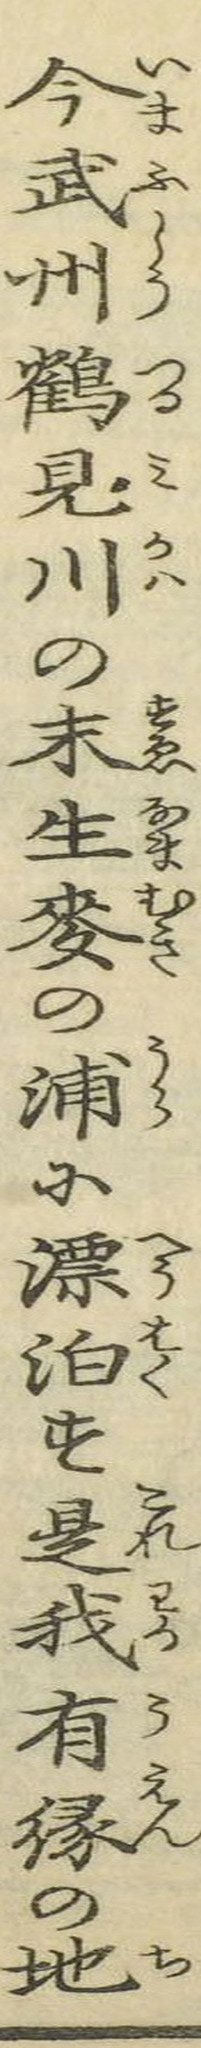今武州鶴見川の末生麥の浦に漂泊す是我有縁の地
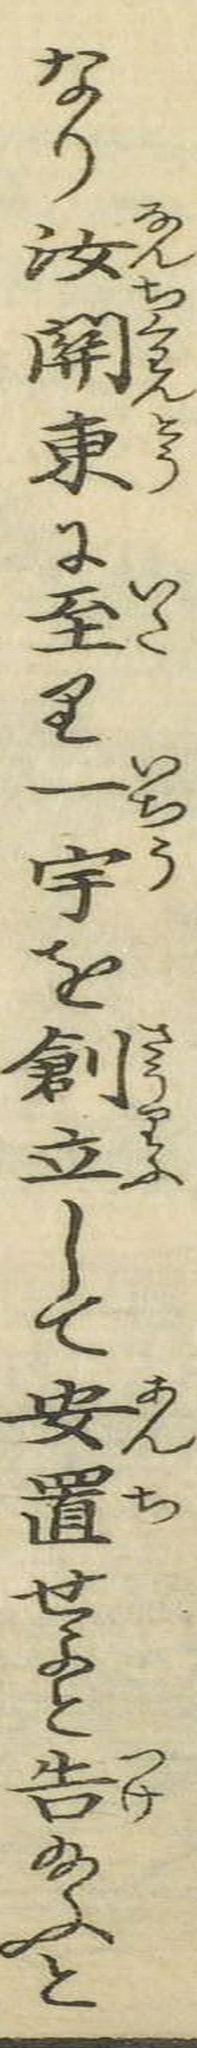なり汝関東に至り一宇を創立して安置せよと告給ふと
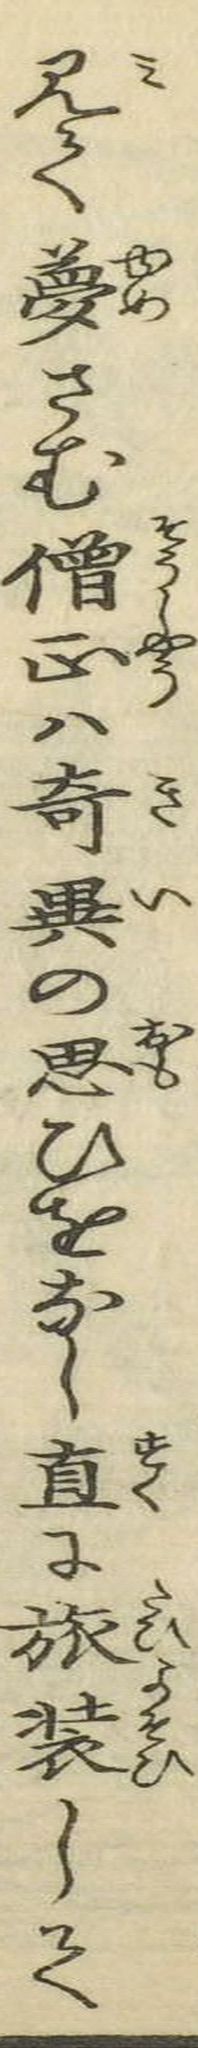見て夢さむ僧正は奇異の思ひをなし直に旅装して
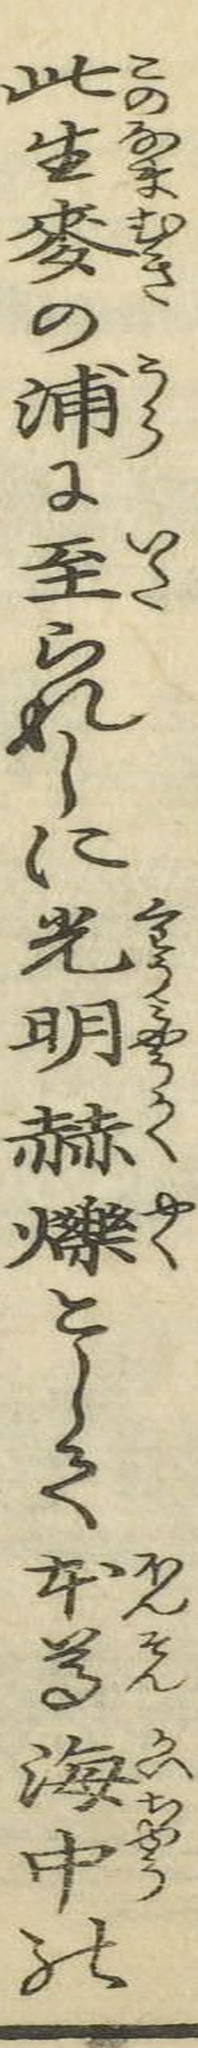此生麥の浦に至られしに光明赫爍として本尊海中の
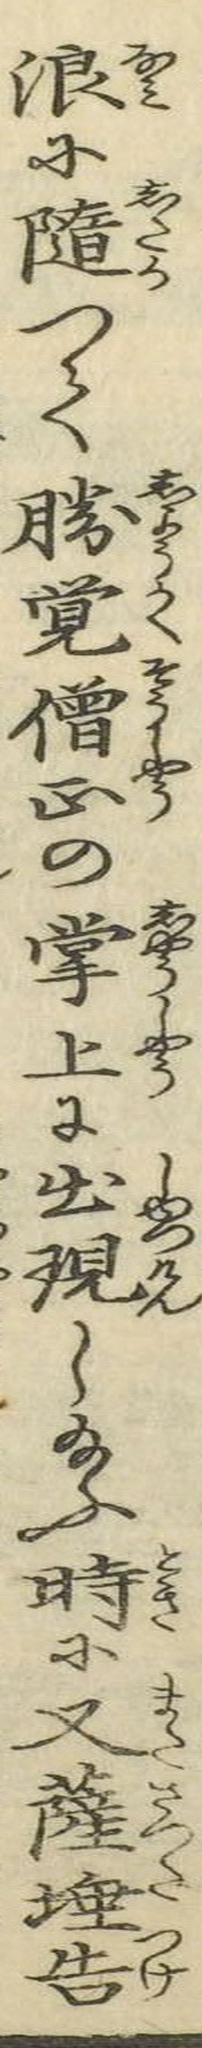浪に随つて勝覚僧正の掌上に出現し給ふ時に又薩埵告
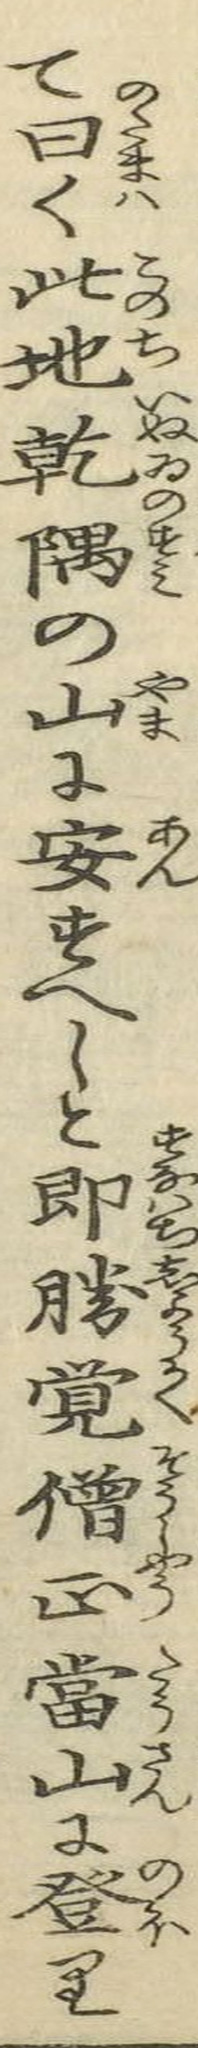て曰く此地乾隅の山に安すへしと即勝覚僧正當山に登り
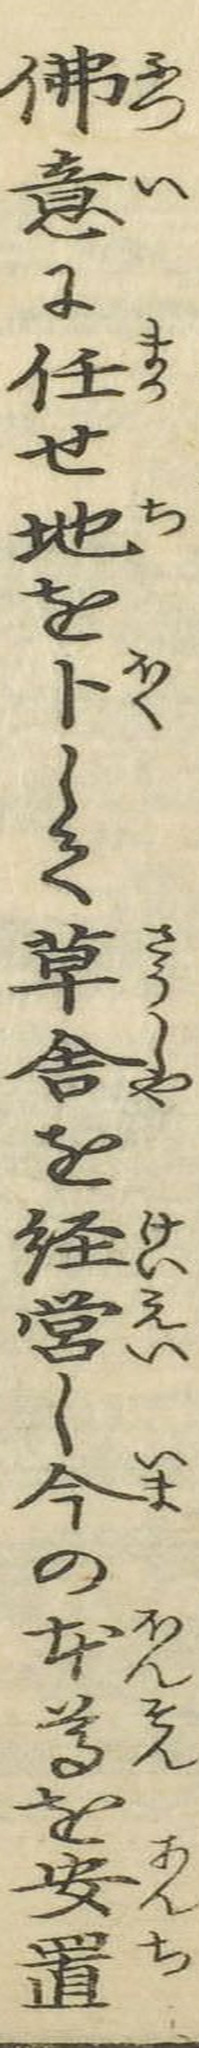佛意に任せ地を卜して草舎を経営し今の本尊を安置
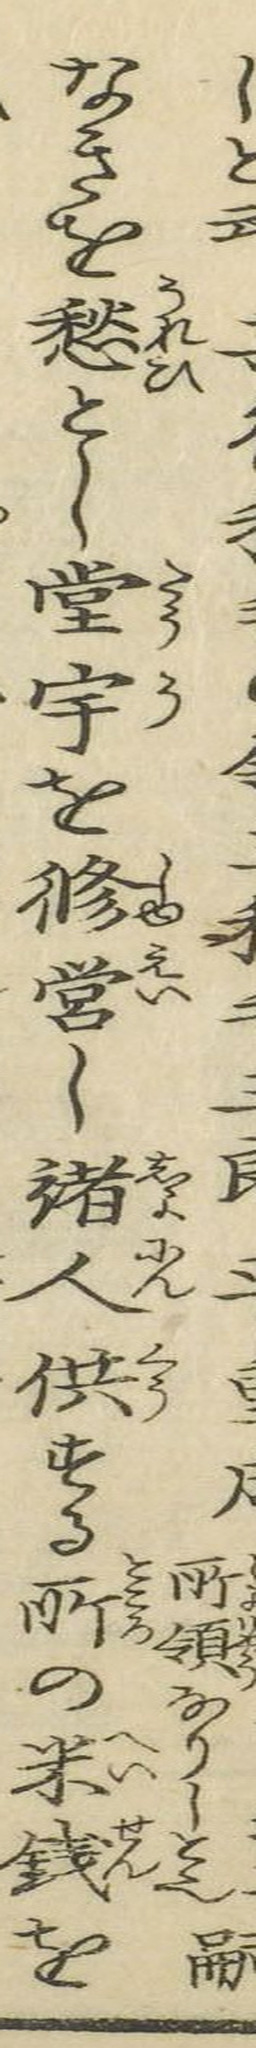なきを愁とし堂宇を修営諸人供する所の米銭を
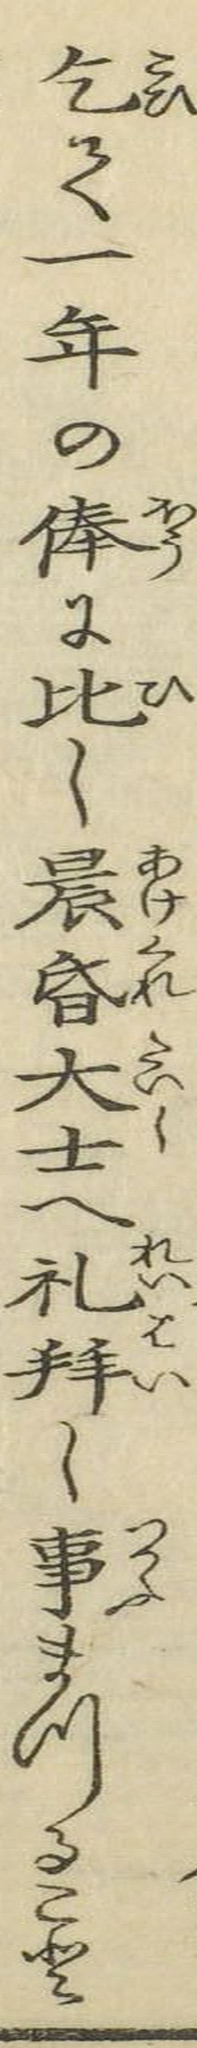乞て一年の俸に比し晨昏大士へ礼拝し事まつること
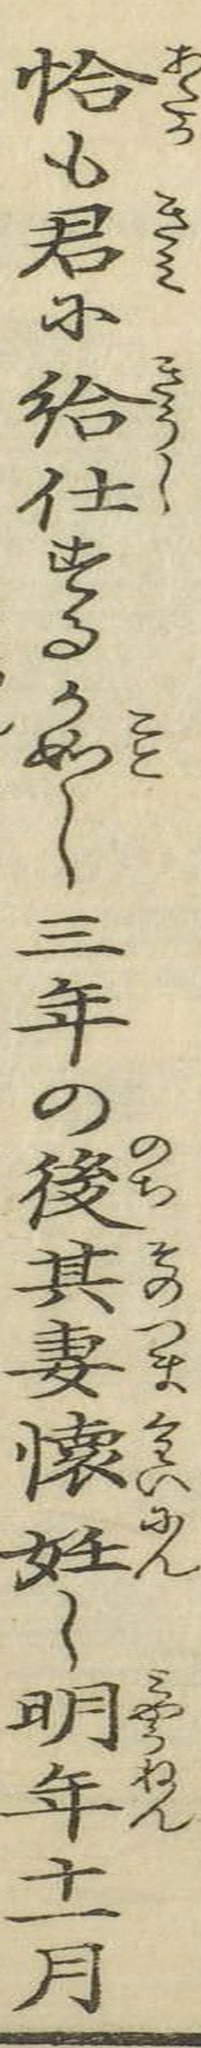恰も君に給仕するか如し三年の後其妻懐妊し明年十一月
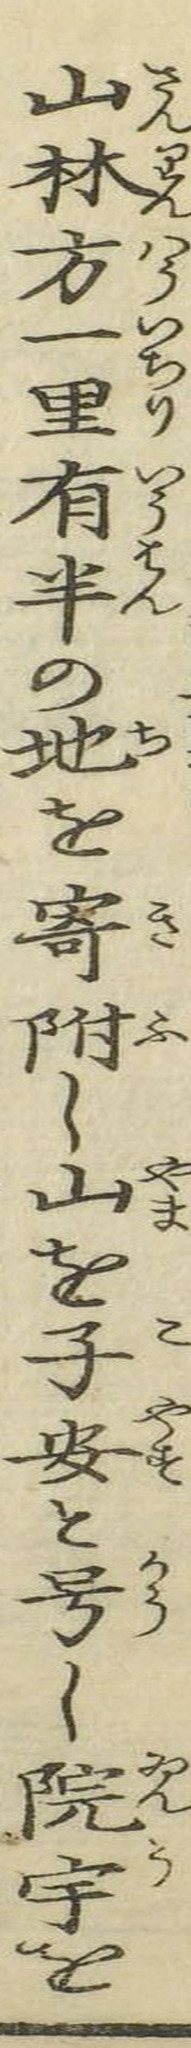山林方一里有半の地を寄附し山を子安と号し院宇を
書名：江戸名所図会 20巻 巻之5
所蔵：東京学芸大学教育コンテンツアーカイブ
